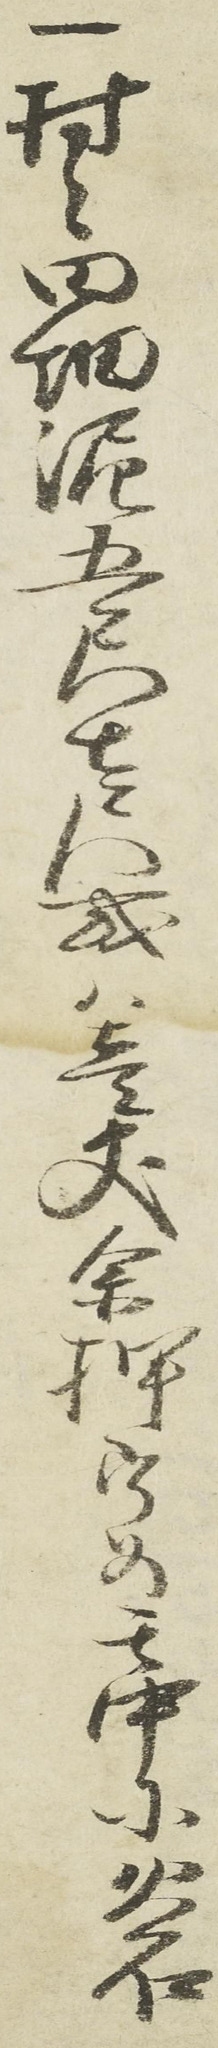一村々田畑泥五尺七尺或ハ壱丈余押うめ其中に火石
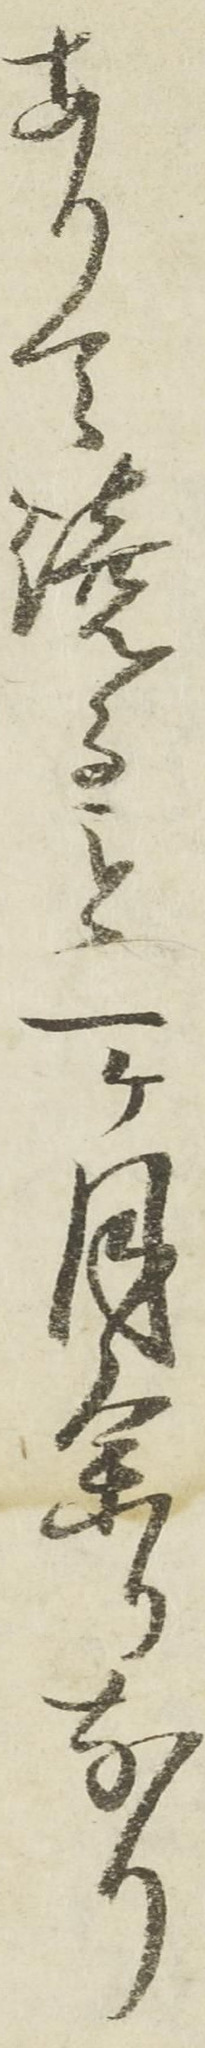ありて焼ること一ケ月余りなり
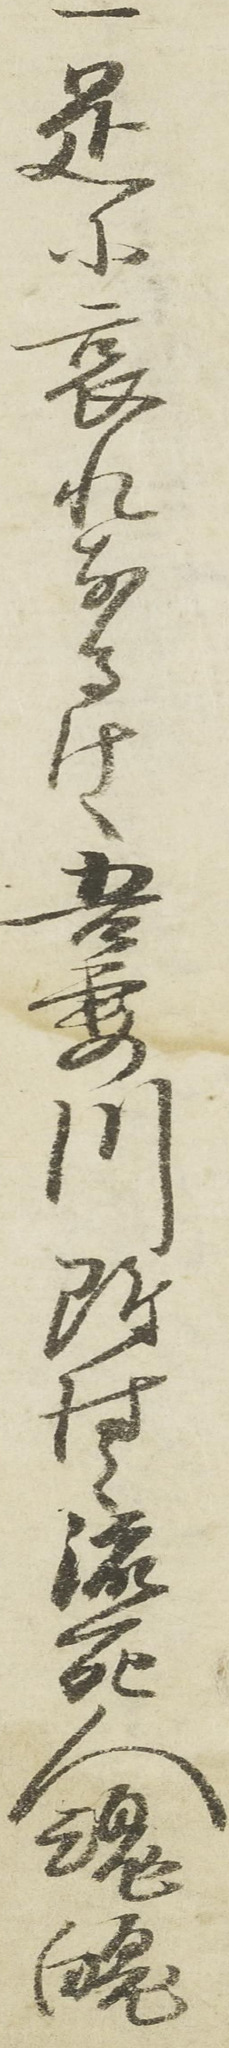一是に哀れなるは吾妻川附村々流死人魂魄
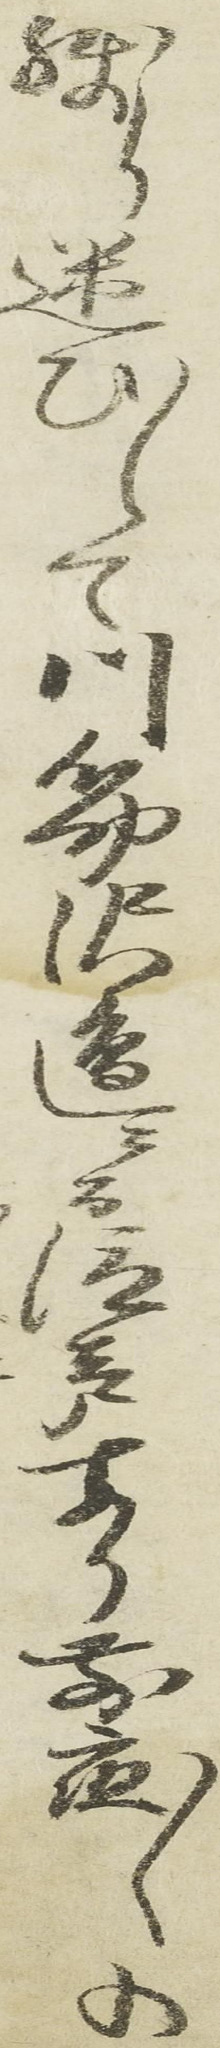残り迷ひして川筋沢辺ニ而泣声あり前夜〳〵の
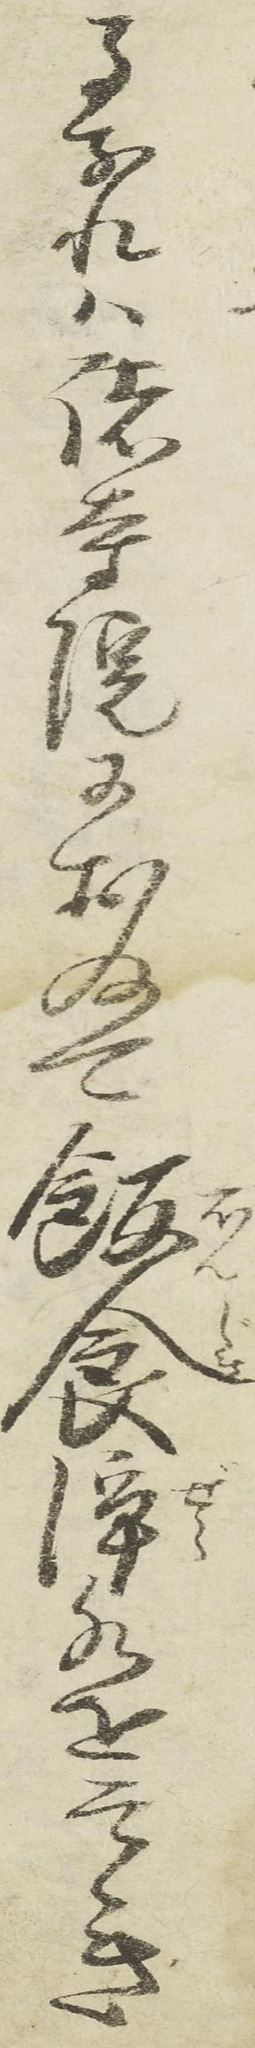事なれハ諸寺院において飯食涬水をそゝき
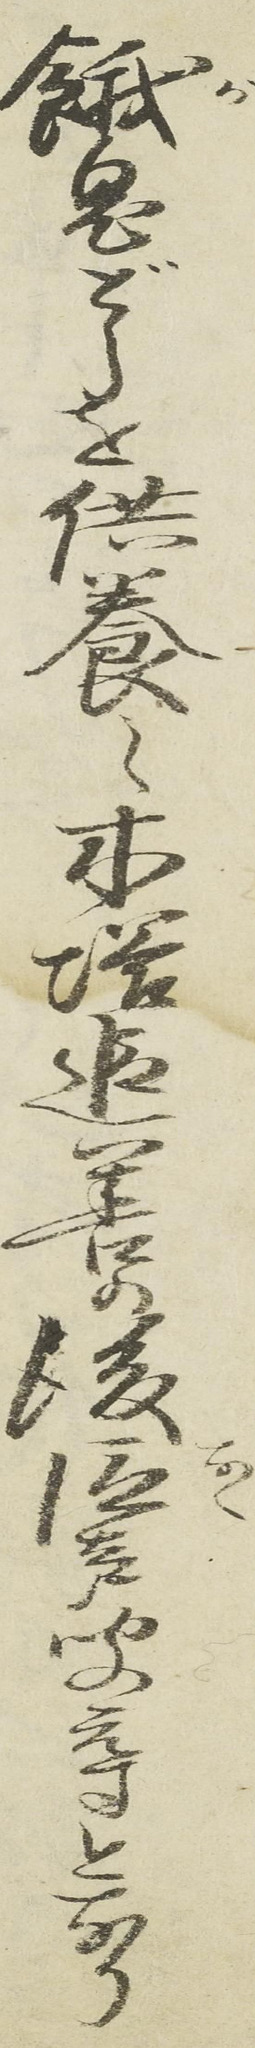餓鬼どしを供養し木増追善の後泣声聞えすとなり
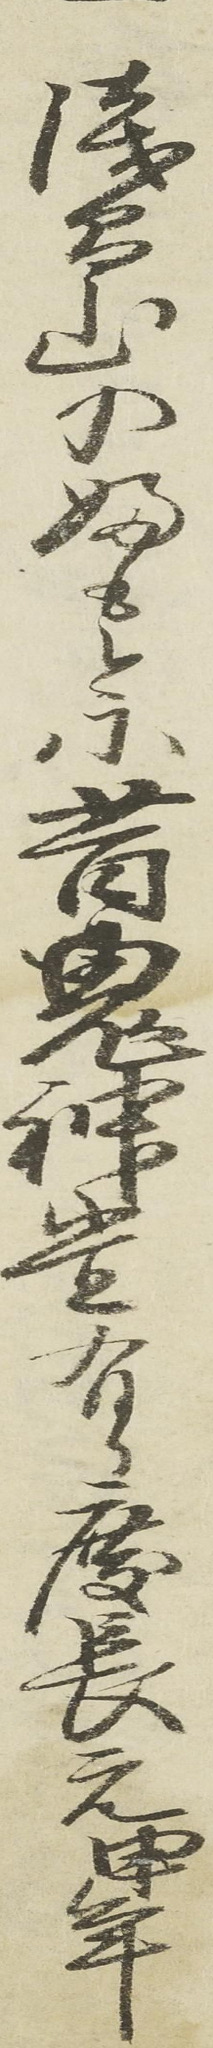一浅間山のふもとに昔鬼神堂有り慶長元申年
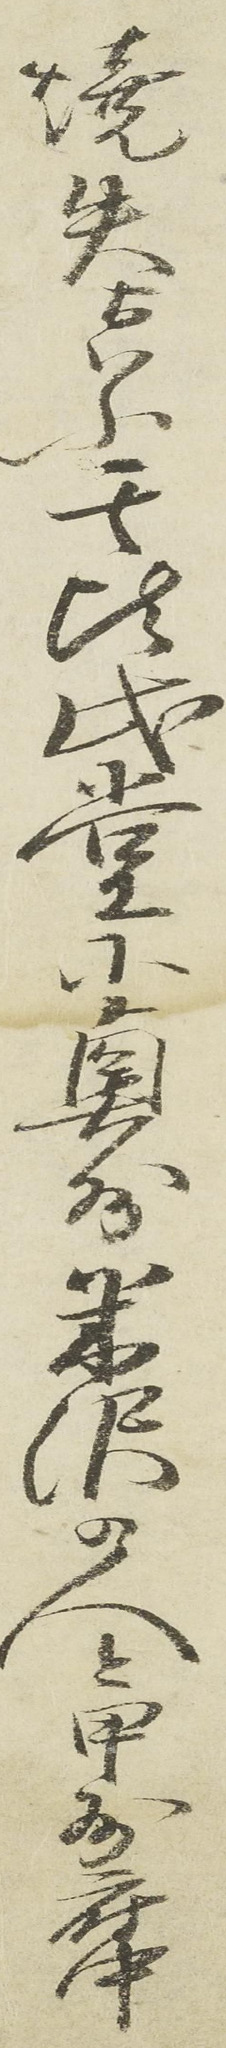焼失といふ其頃堂に奥州米沢の人と甲州府中
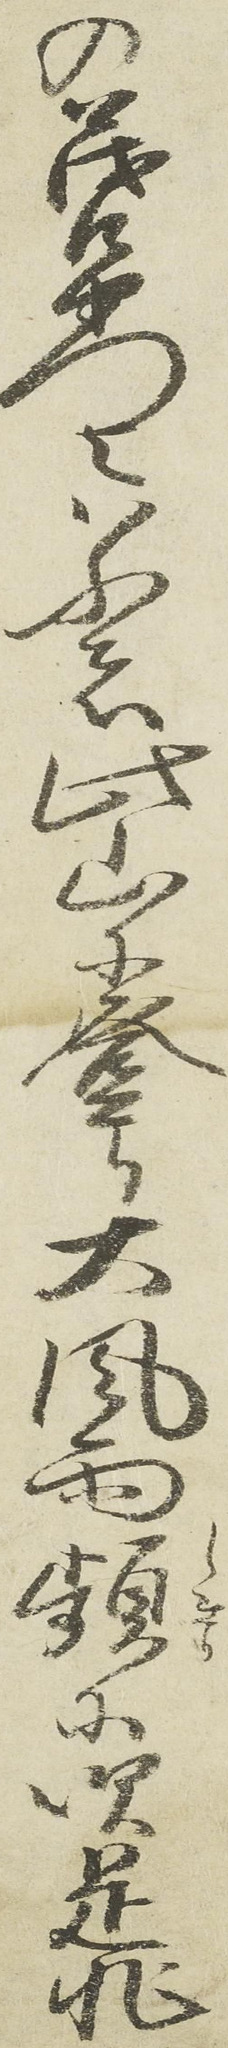の茂左衛門といふ者此山に登り大風雨頻に吹是非
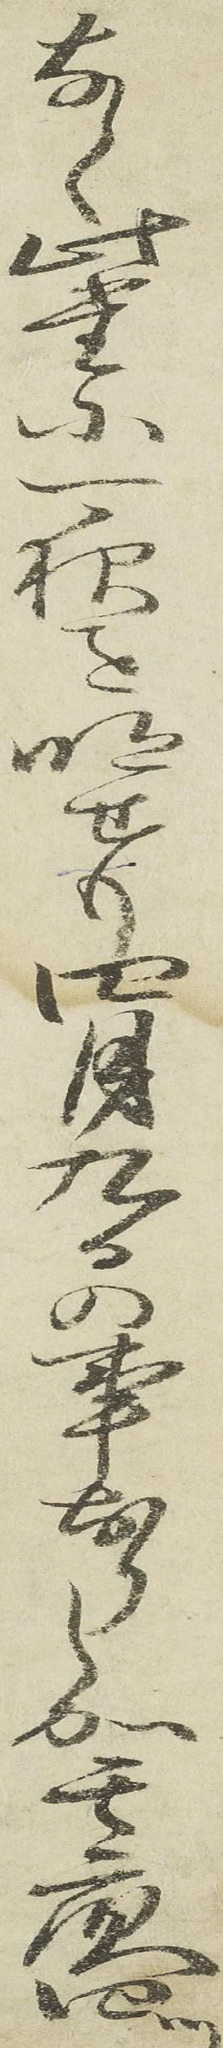なく此堂に一夜を明せり四月九日の事なりしが其夜四ツ
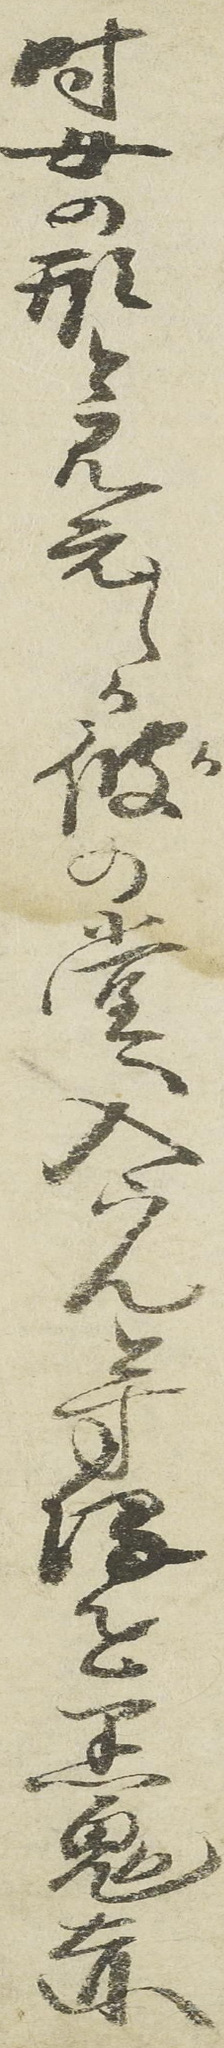時女の形と見えしか彼の堂へ入らんとするを黒鬼赤
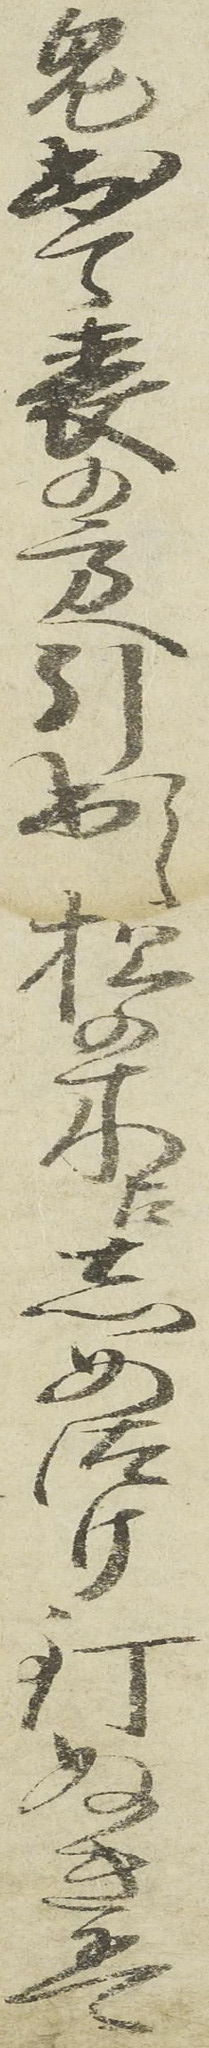鬼出て表の方へ引出し松の木えしめつけ釘ぬきは
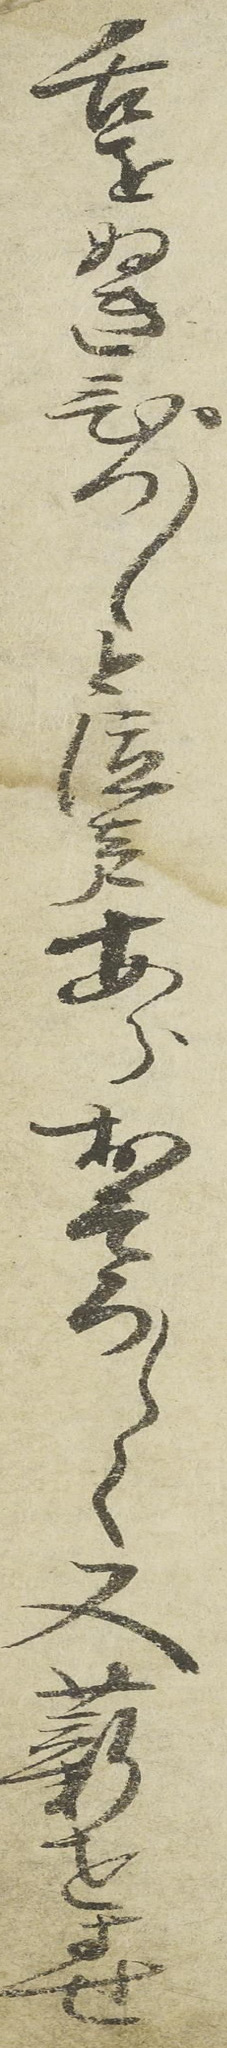舌をぬきひつしと泣声ありおそろしく又薪をよせ

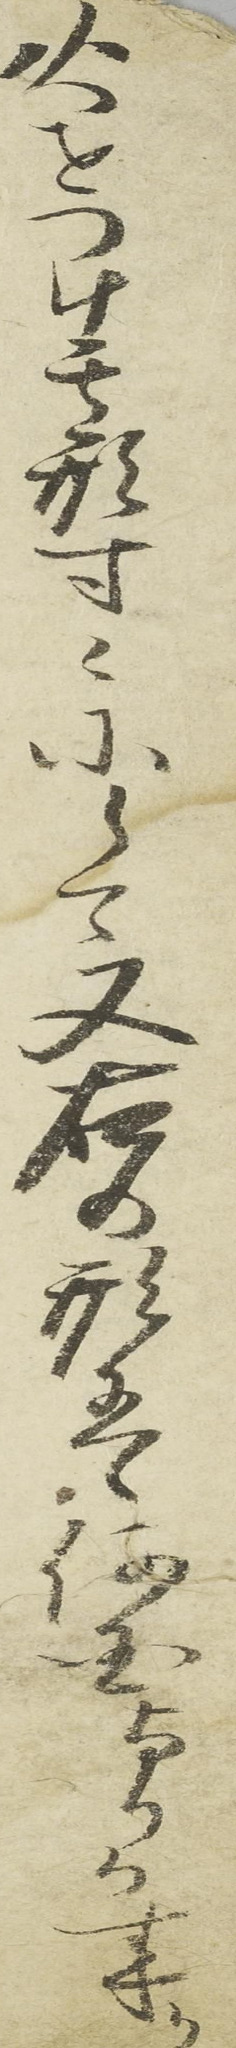火をつけ其形すくにして又右の形にて何国よりか来り
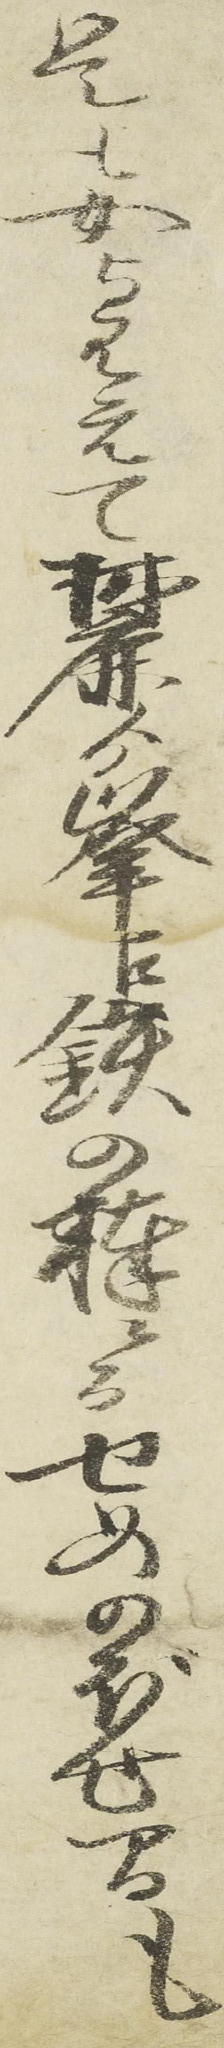是も女と見えて麓ゟ峯え鉄の棒ニ而セめのぼせ間も
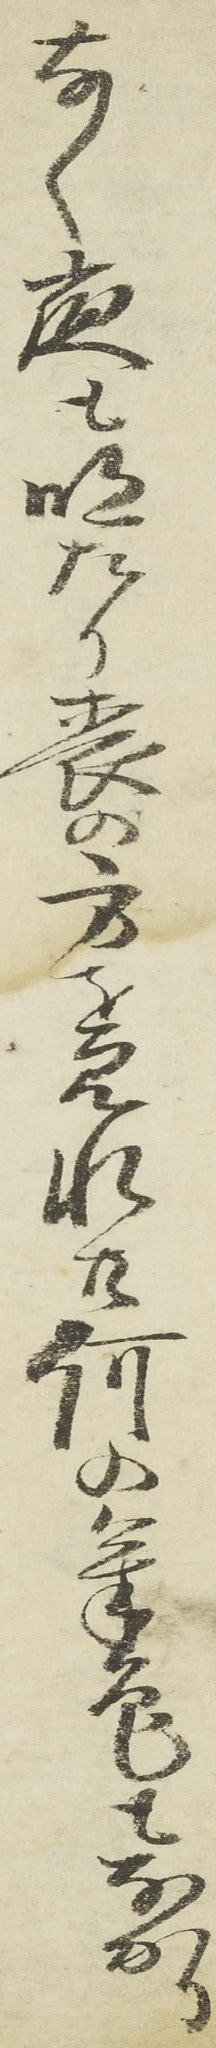なく夜も明たり裏の方を見れ共何の気色もなかり
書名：浅間大変略記
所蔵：東京大学地震研究所図書室 Earthquake Research Institute Library, The University of Tokyo, JAPAN
